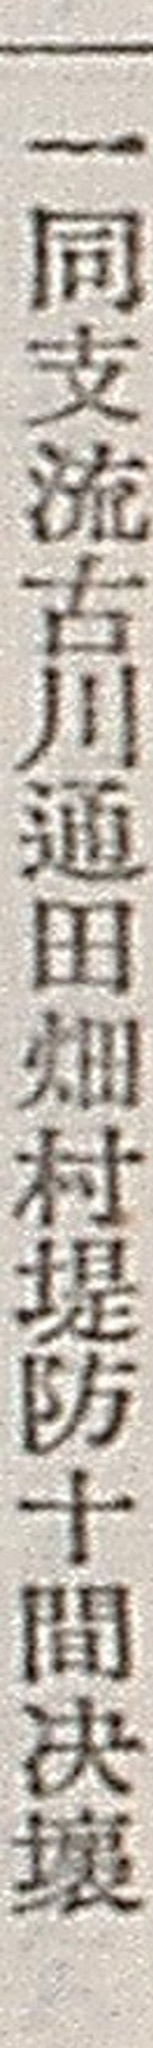一同支流古川通田畑村堤防十間决壊
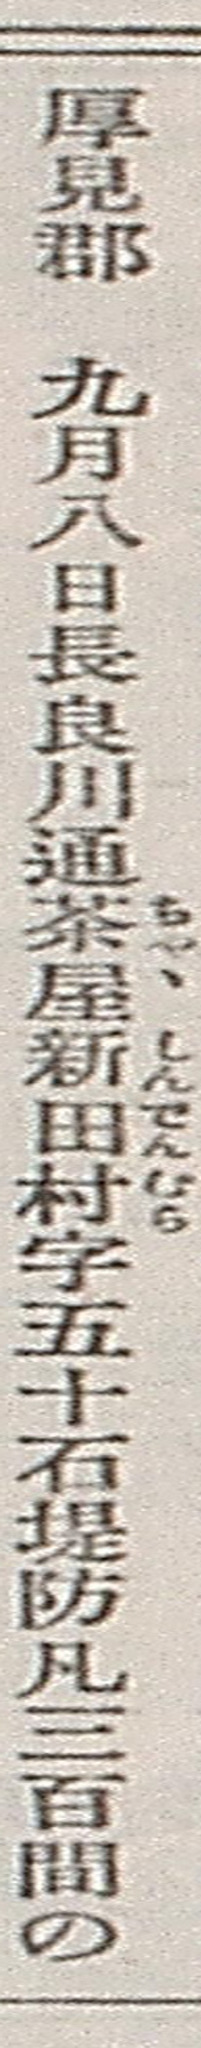厚見郡九月八日長良川通茶屋新田村字五十石堤防凡三百間の
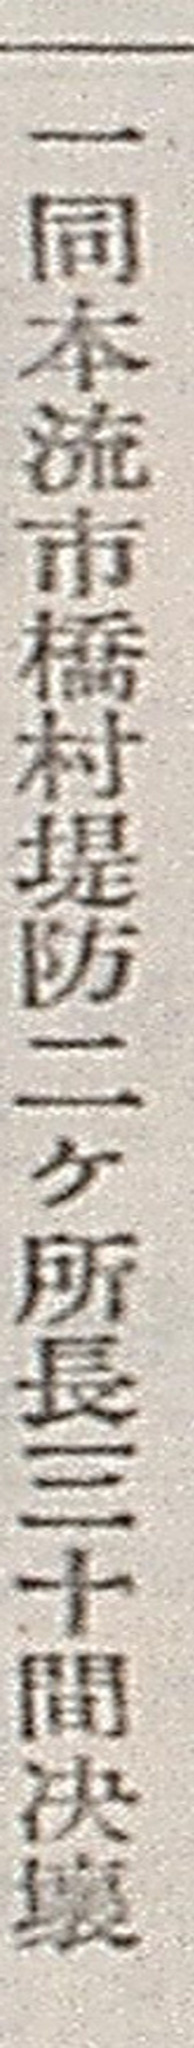一同本流市橋村堤防二ヶ所長三十間决壊
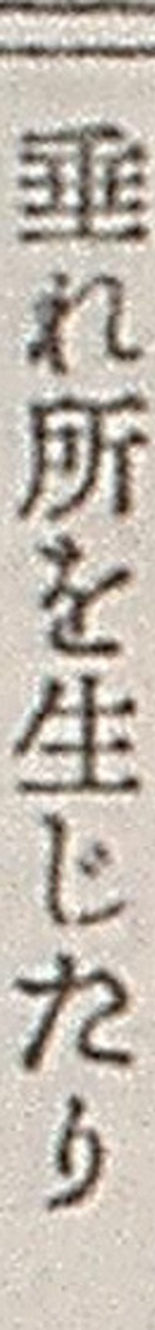垂れ所生じたり
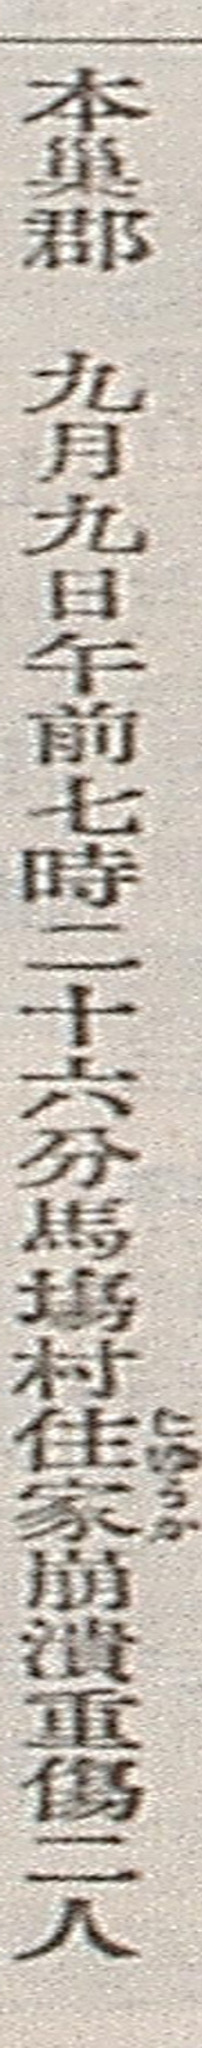本巣郡九月九日午前七時二十六分馬場村住家崩潰重傷二人
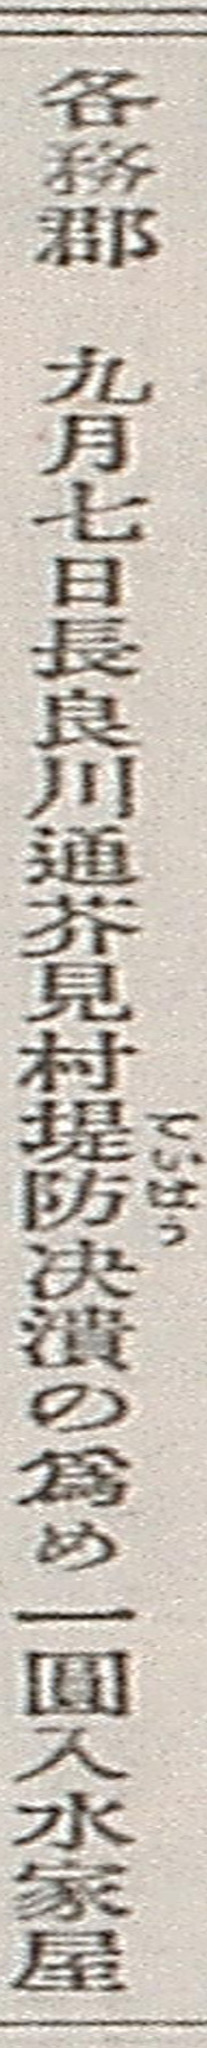各務郡九月七日長良川通芥見村堤防决潰の為め一円入水家屋
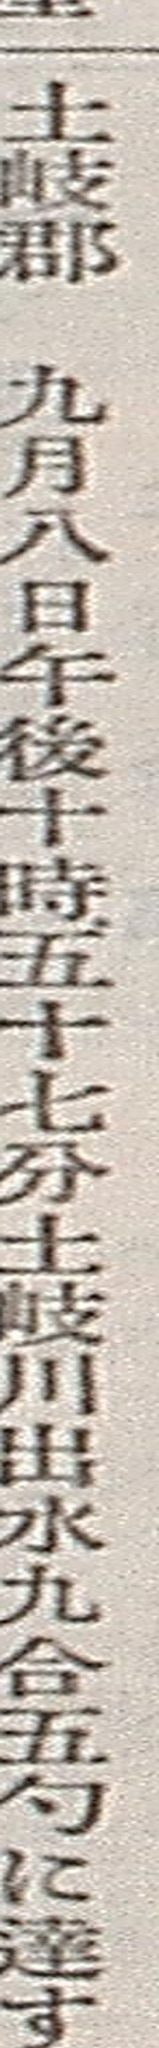土岐群九月八日午後十時五十七分土岐川出水九合五勺に達す
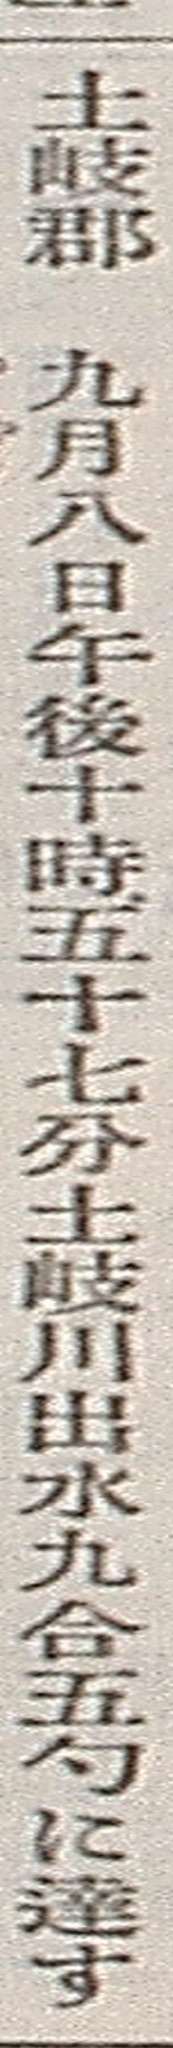土岐群九月八日午後十時五十七分土岐川出水九合五勺に達す
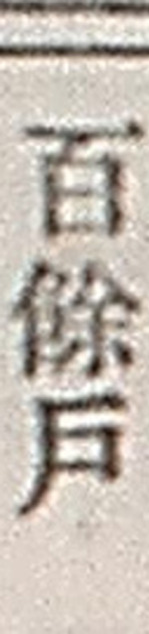百餘戸
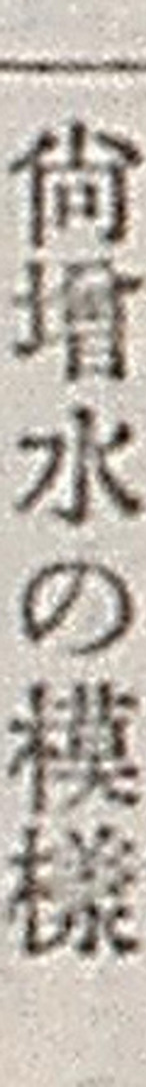尚増水の模様
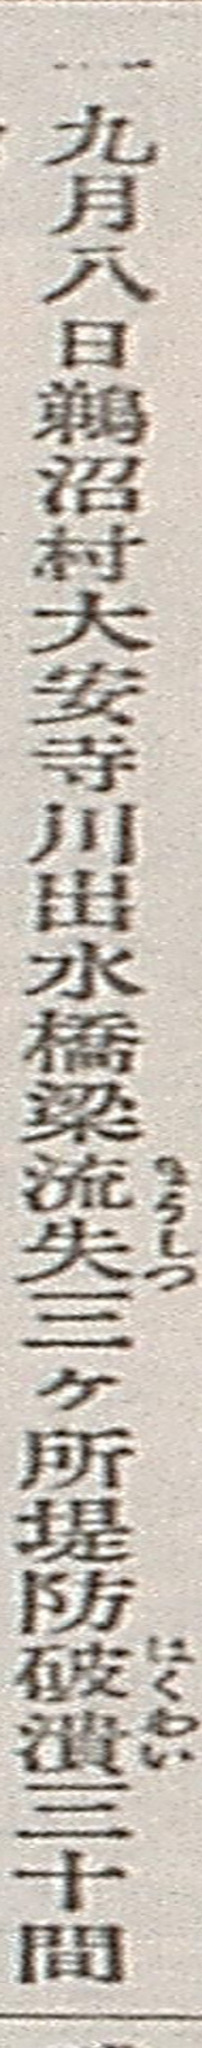一九月八日鵜沼村大安寺川出水橋梁流失三ヶ所堤防破壊三十間
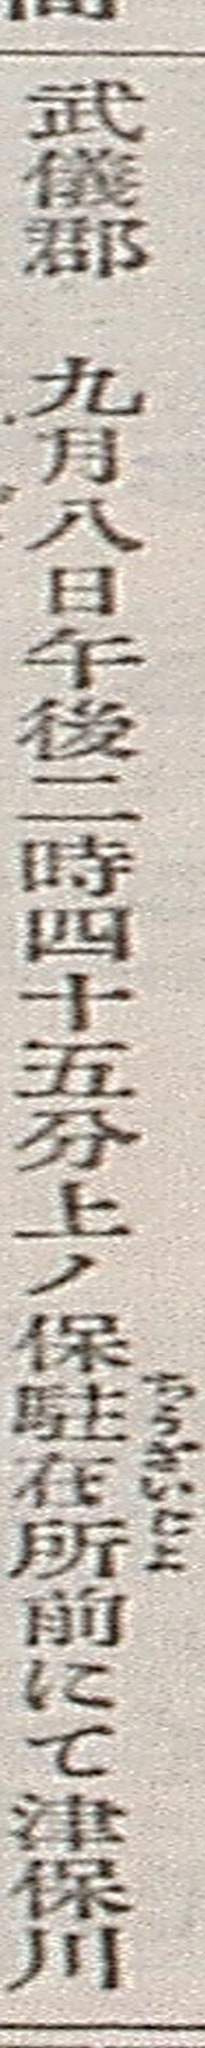武儀郡九月八日午後二時四十五文上ノ駐在所前にて津保川
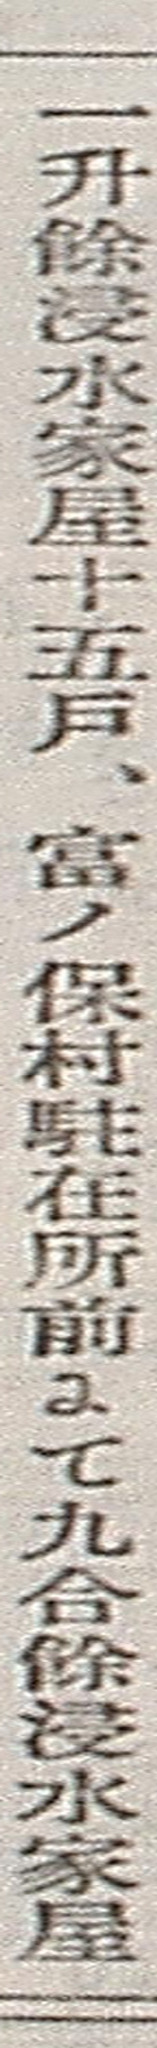一升餘浸水家屋十五戸、冨ノ保村駐在所前にて九合餘浸水家屋
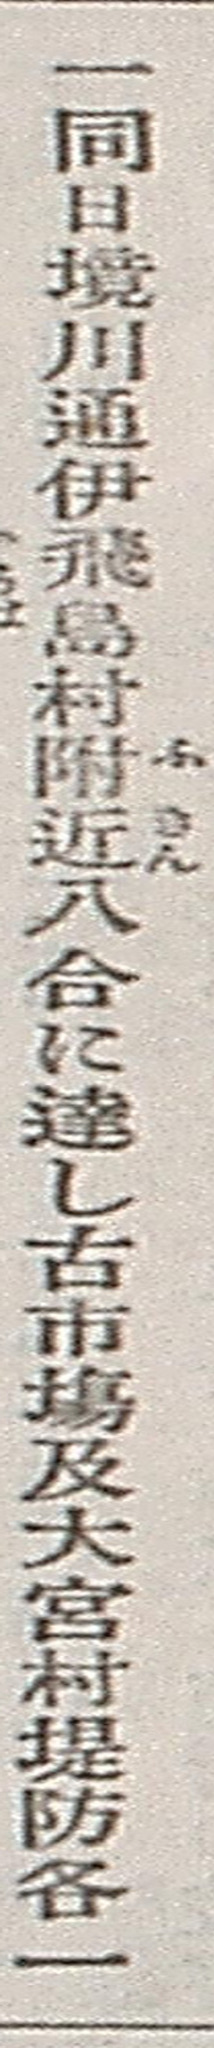一同日境川通伊飛島村附近八合に達し古市場及大宮村堤防各一
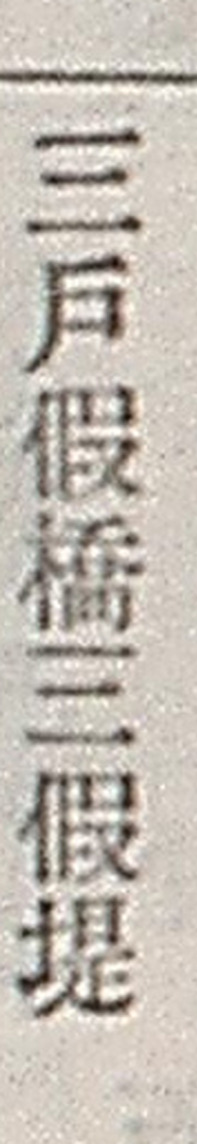三戸仮橋三仮堤
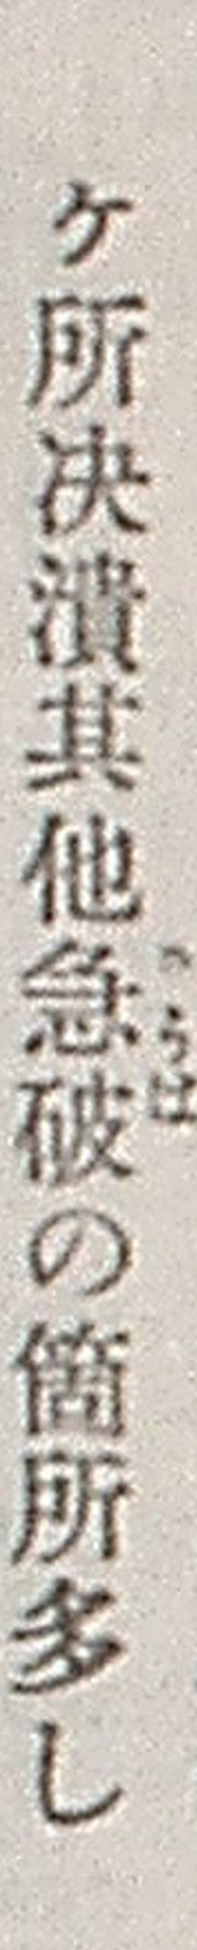ヶ所决潰其他急破の箇所多し
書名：風俗畫報臨時増刊第百二十六號　洪水被害録（中）
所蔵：東京大学地震研究所図書室 Earthquake Research Institute Library, The University of Tokyo, JAPAN
